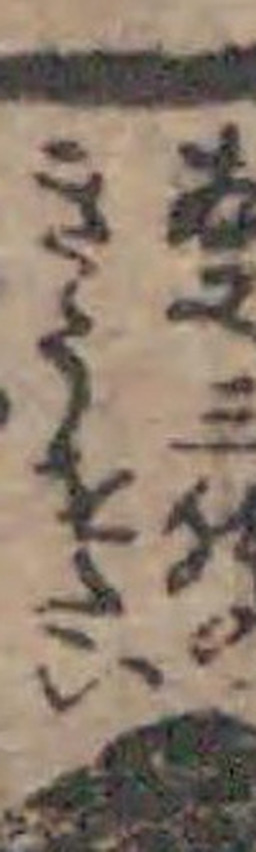きうをたい
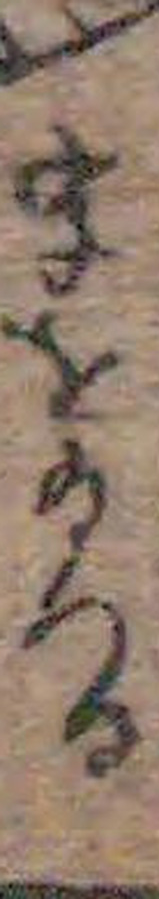字を給はる
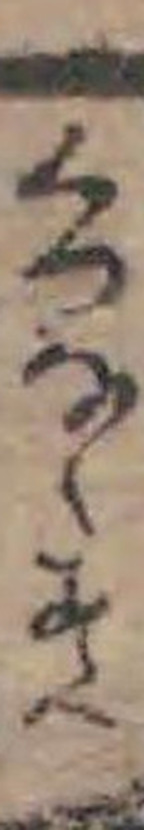くつなくすへ
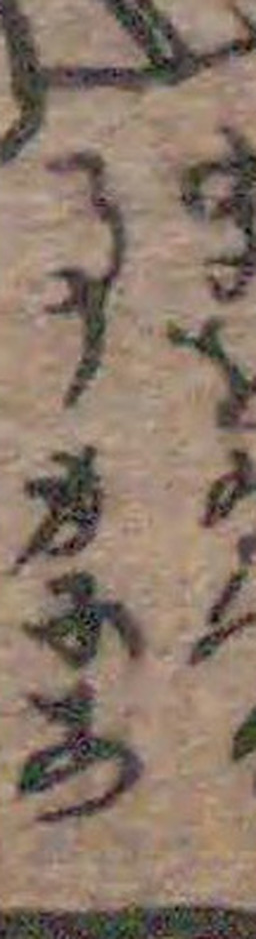事身にあ
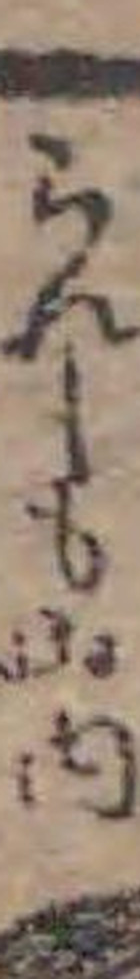られしも山内
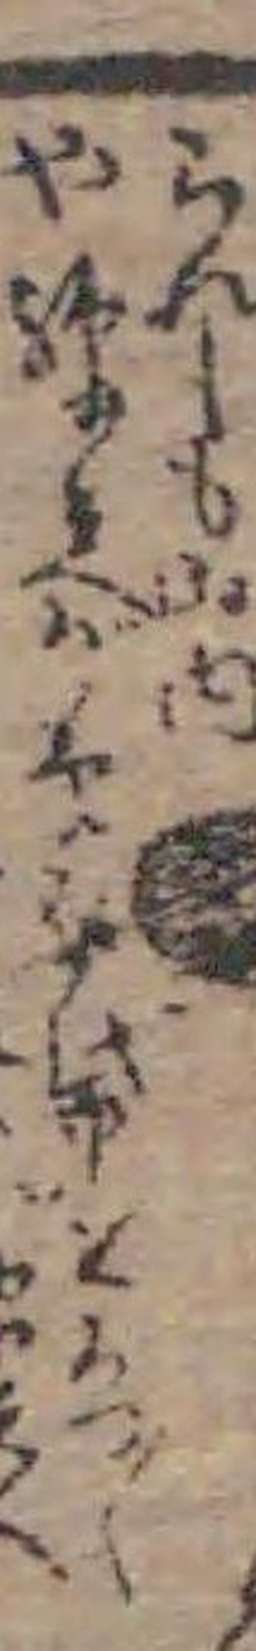や孫兵へが草双紙をかつ〳〵
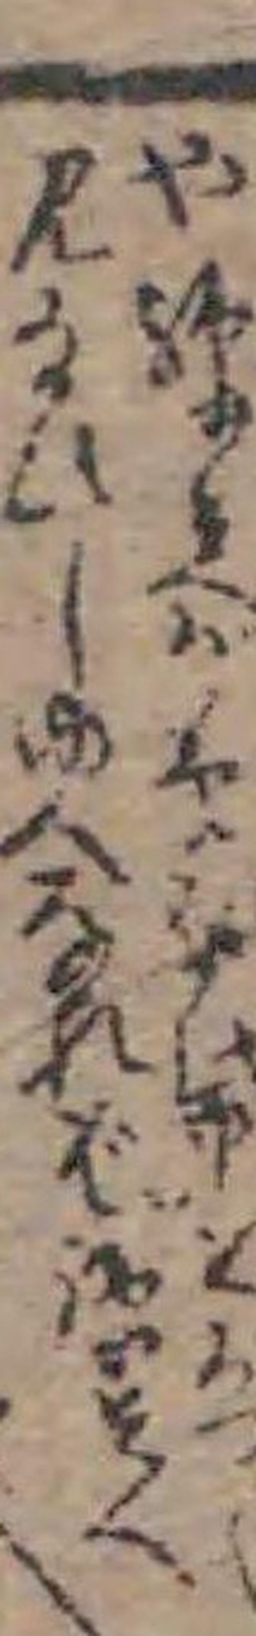見給ひしゆへなれば孫兵へ
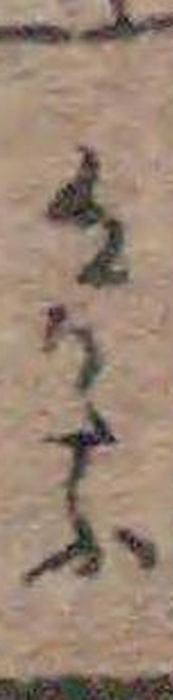有かたふ
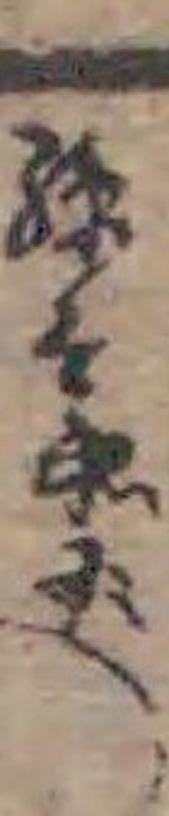孫兵衛に
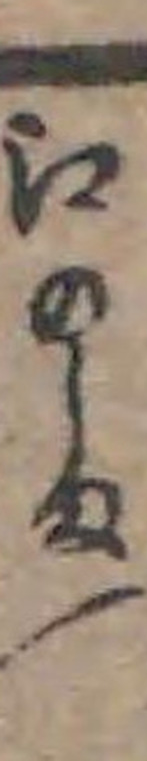江のしま
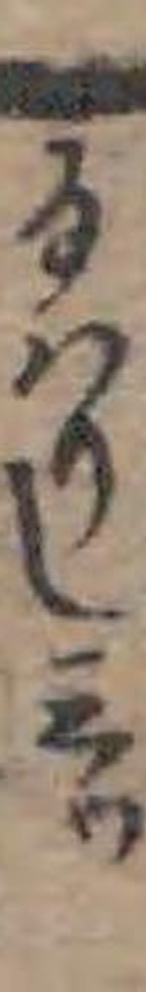給はりし三つ
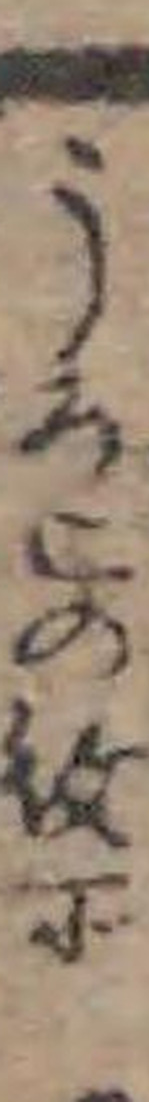うろこの紋所
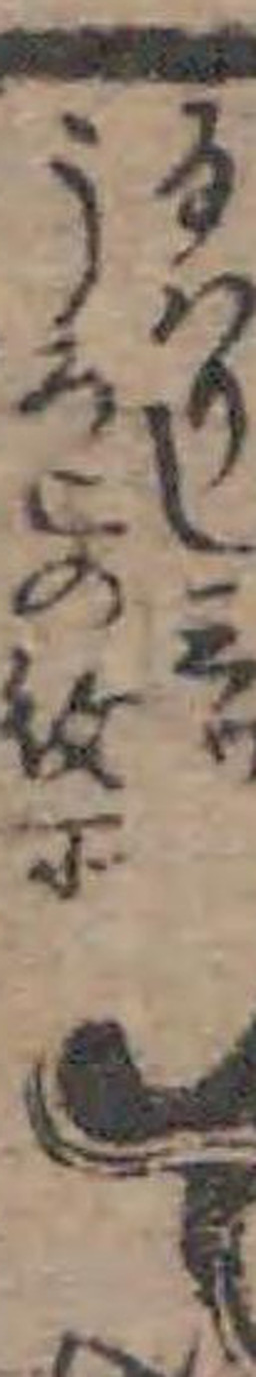うろこの紋所
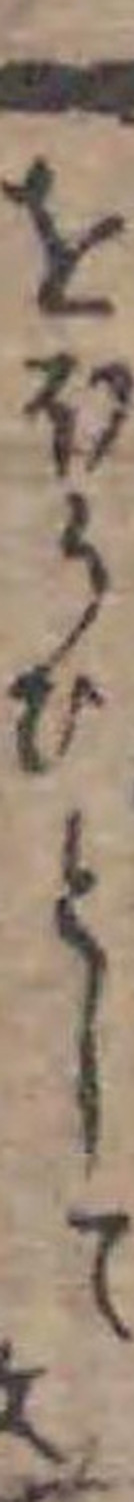をほうひとして
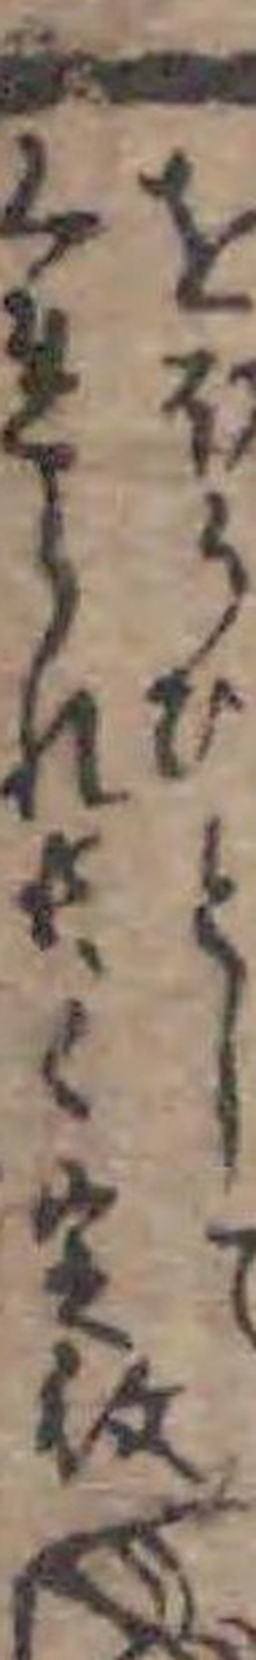くれられ長く定紋
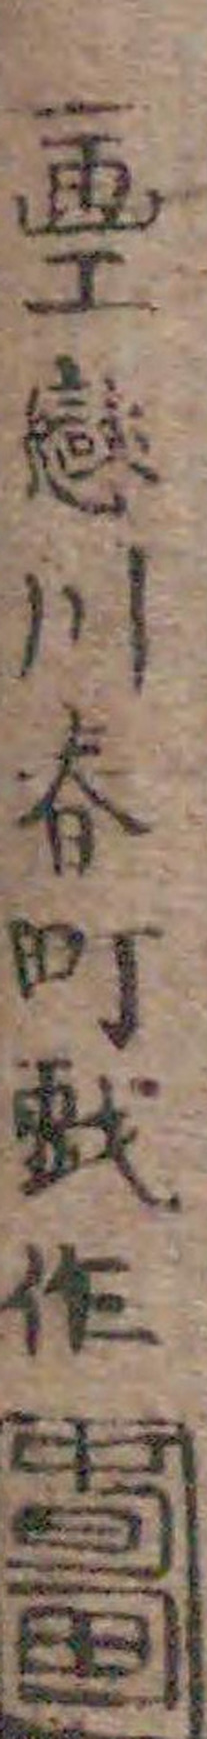画工恋川春町戯作
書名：三舛増鱗組 : 3巻
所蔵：国立国会図書館 National Diet Library, JAPAN
